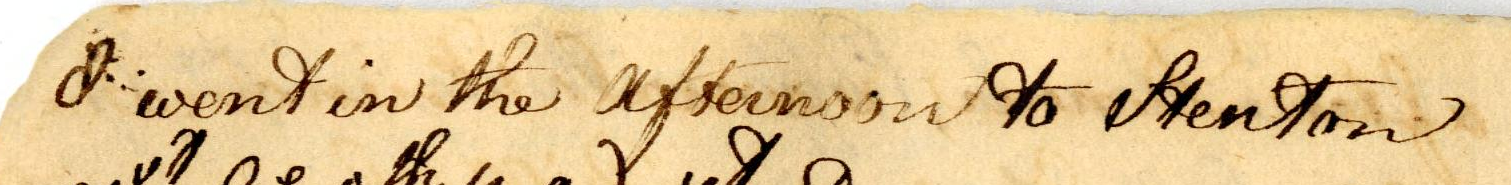8 went in the Afternoon to Stenton
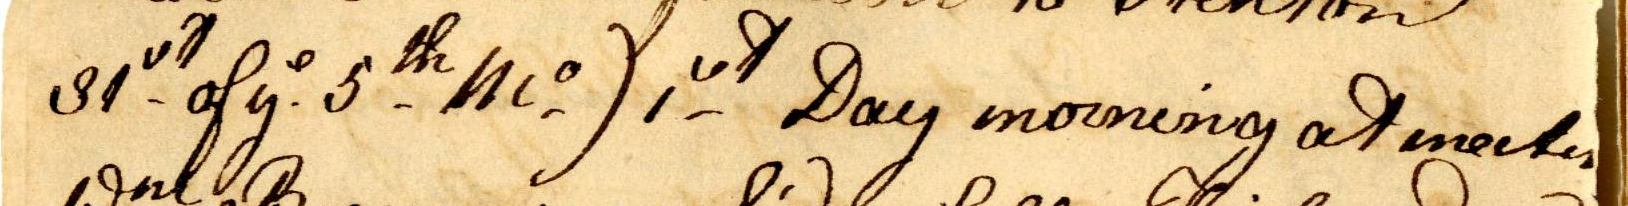31^st of y^e 5^th M^o ) 1^st Day morning at meeti
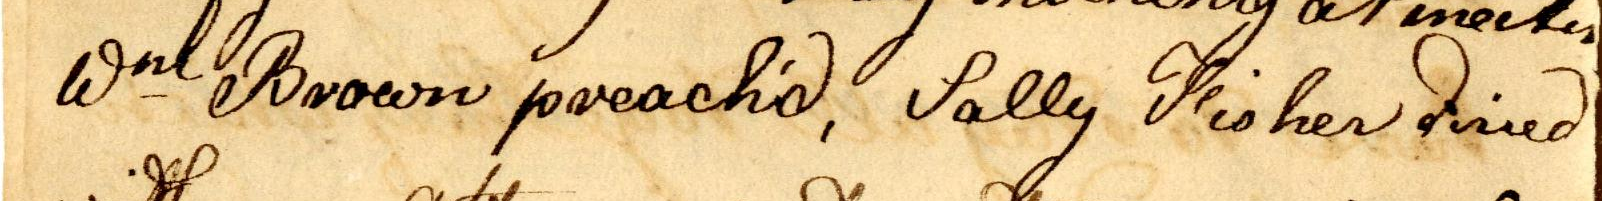W^m Brown preach'd, Sally Fisher dined
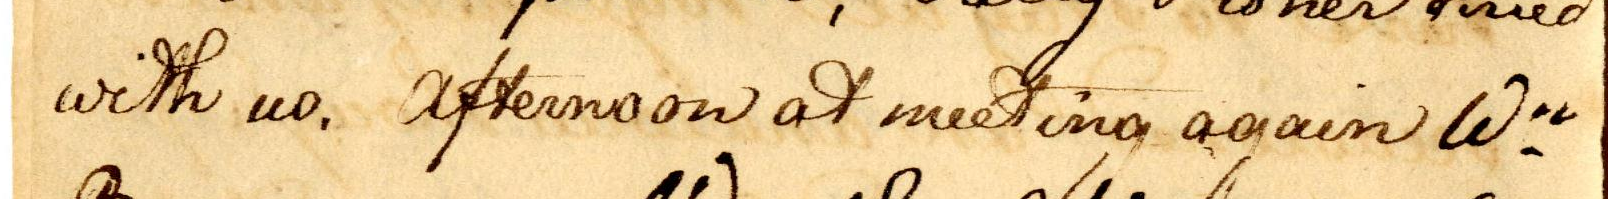with us. Afternoon at meeting again W^m.
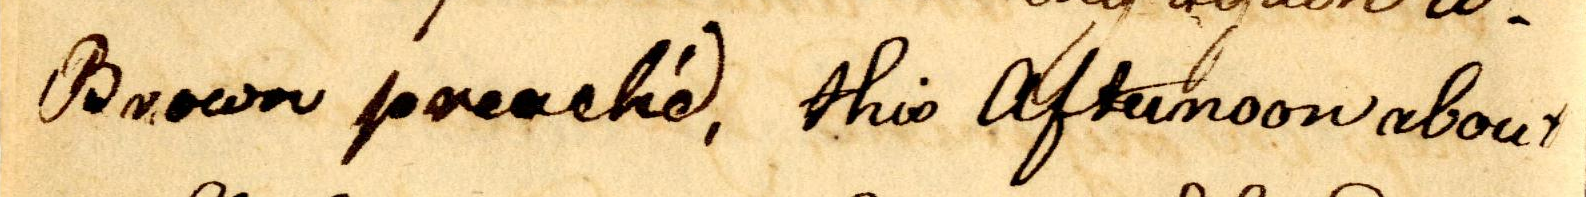Brown preach'd, this Afternoon about
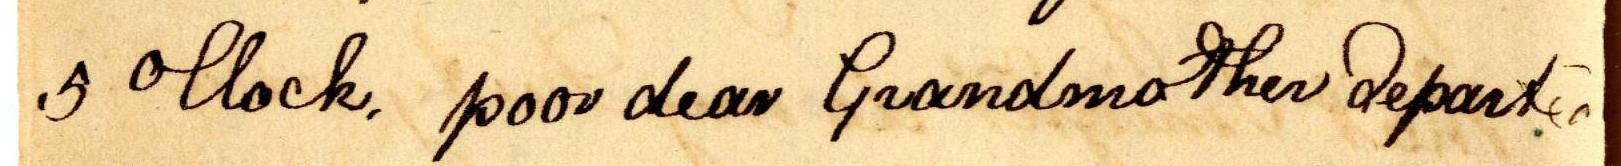5 ^oClock, poor dear Grandmother departed
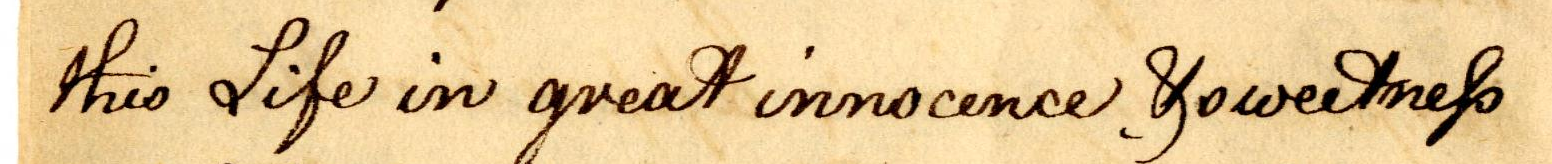this Life in great innocence & sweetness
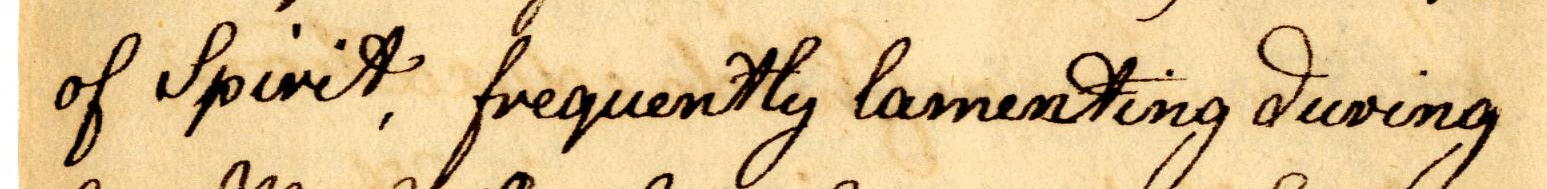of Spirit, frequently lamenting during
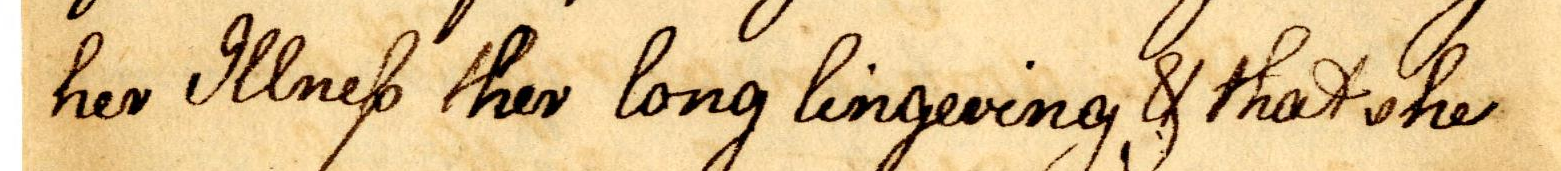her Illness ther long lingering & that she
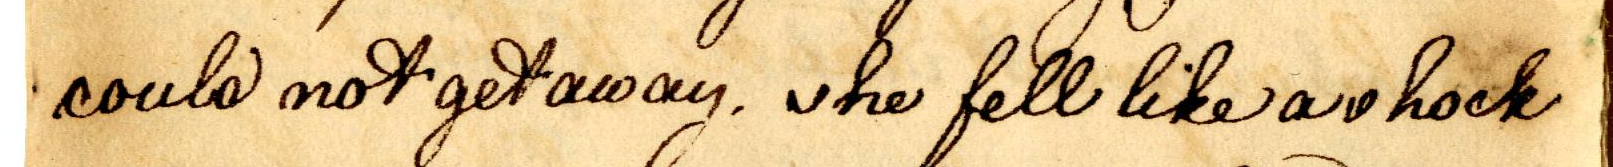could not get away, she fell a shock
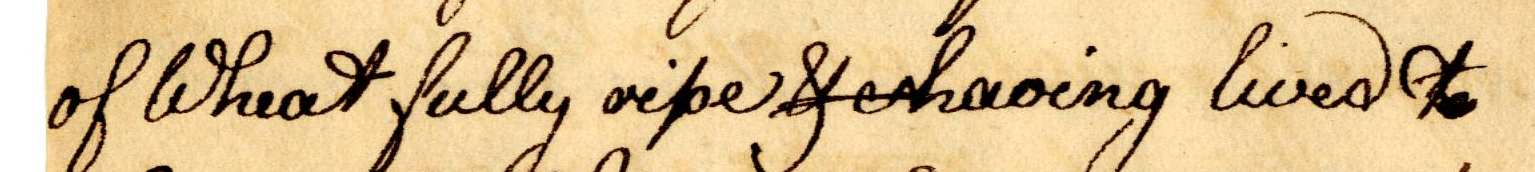of Wheat fully ripe [_] chasing lived to
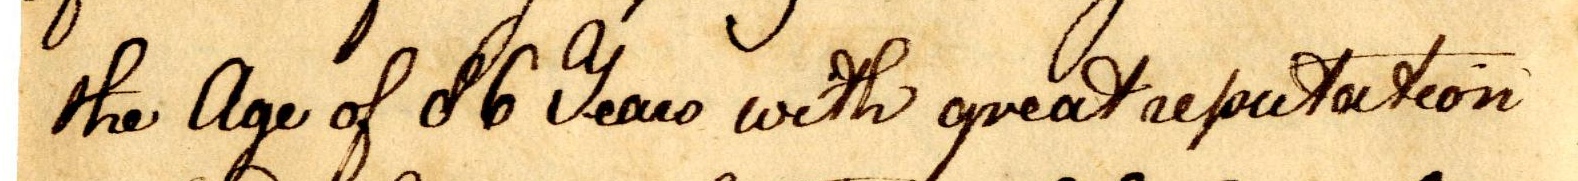the Age of 86 Years with great reputation
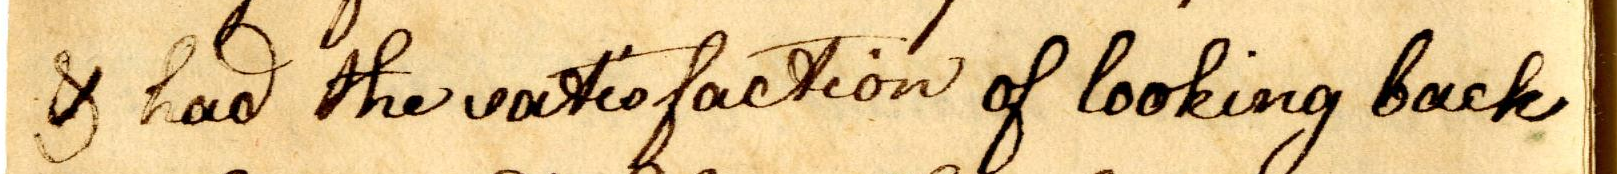& had the satisfaction of looking back
